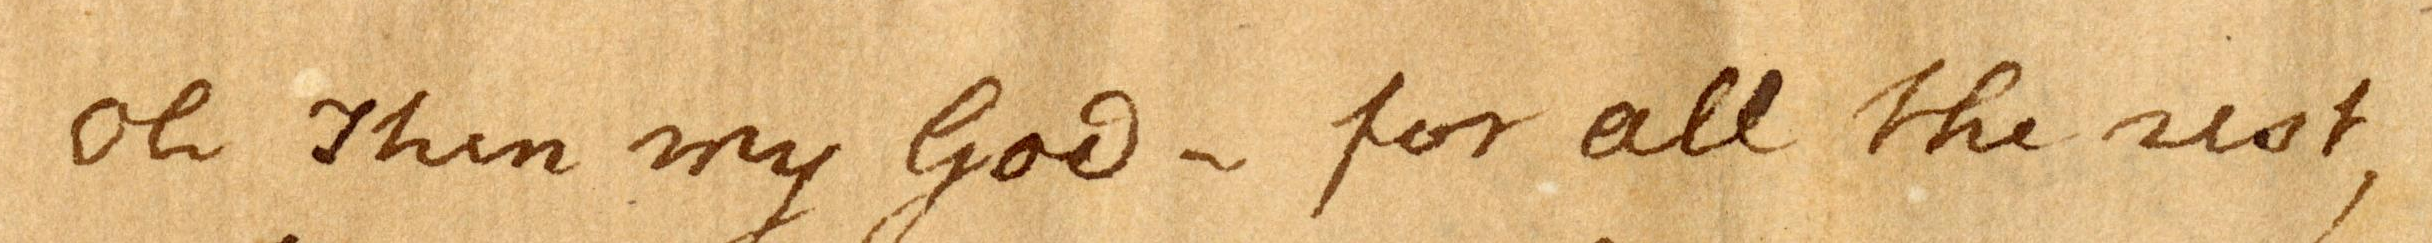Oh Then my God- for all the rest,
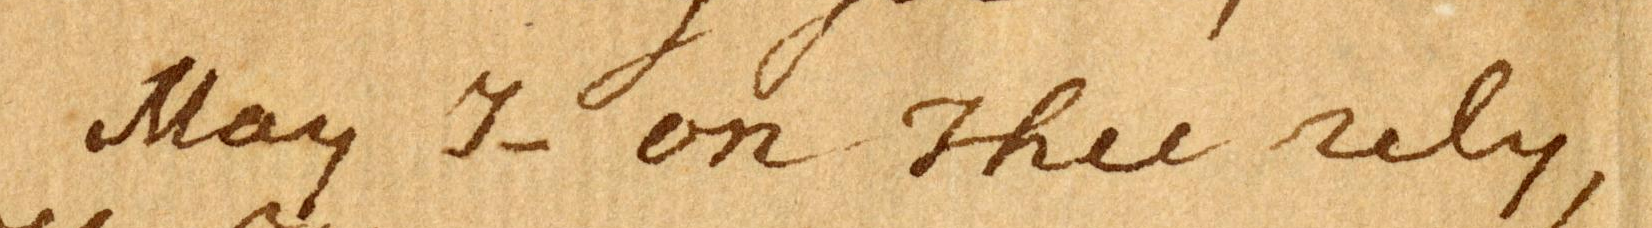May I- on Thee rely,
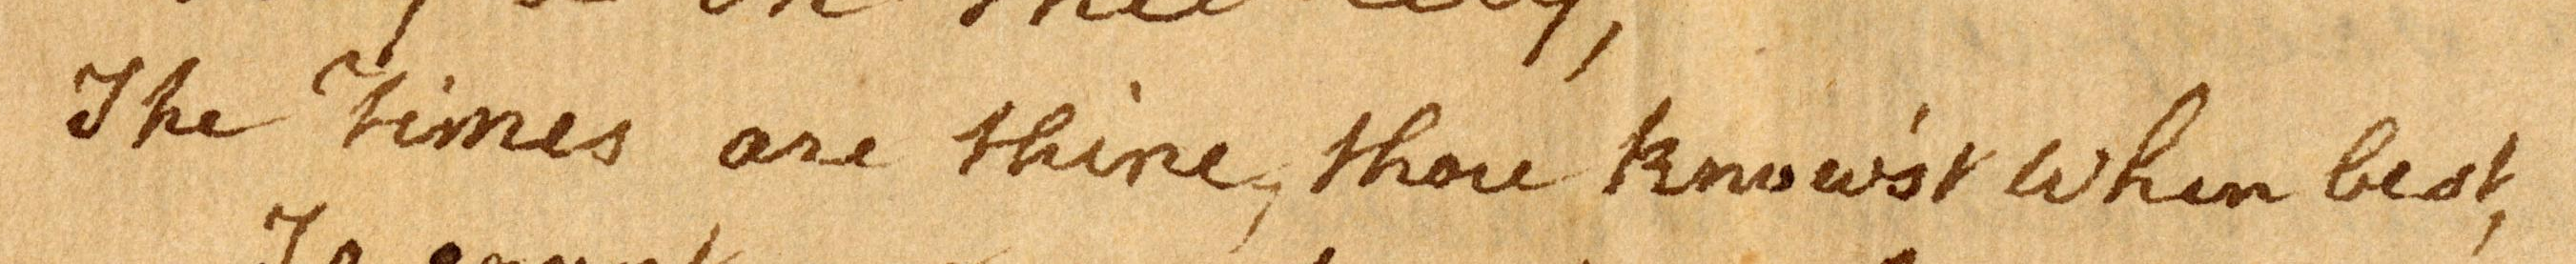The times are thine, thow know'st when best,
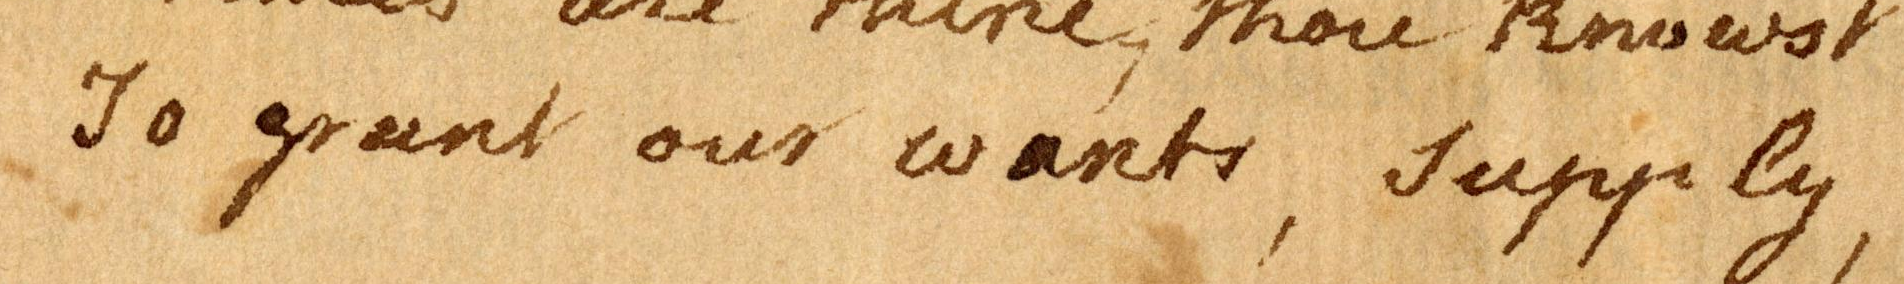To grant our wants, supply,
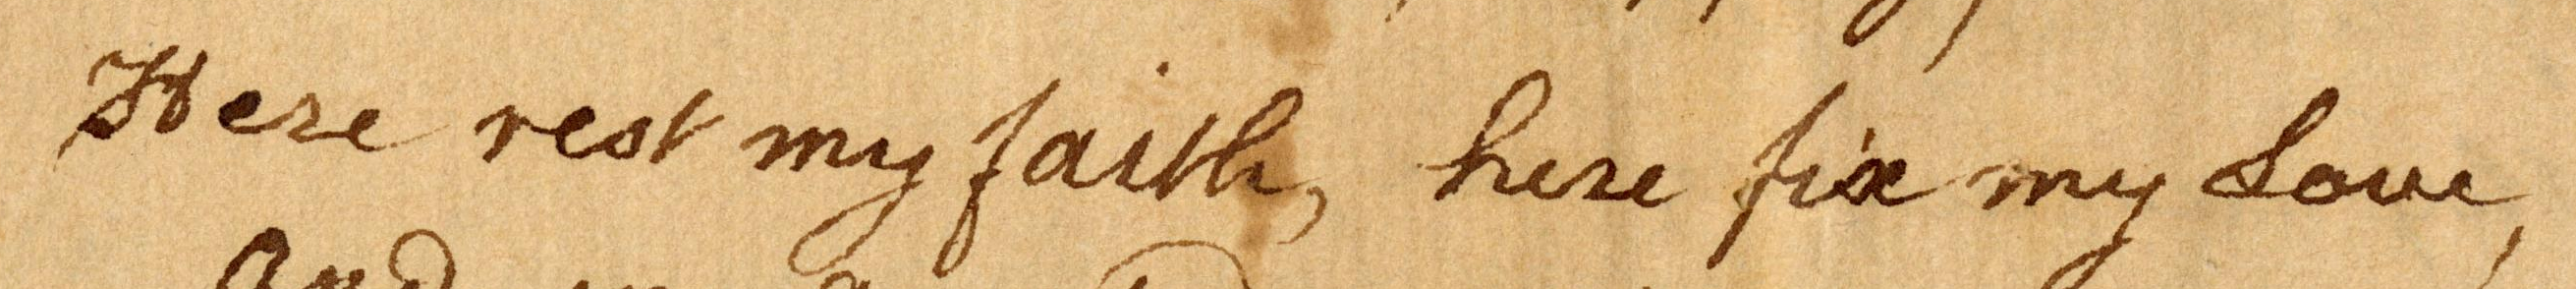Here rest my faith, here fix my Love,
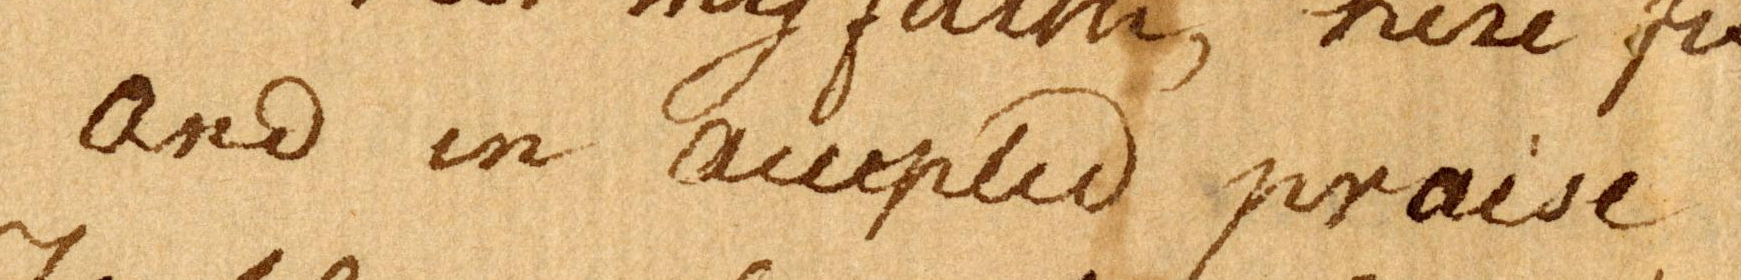And in accepted praise
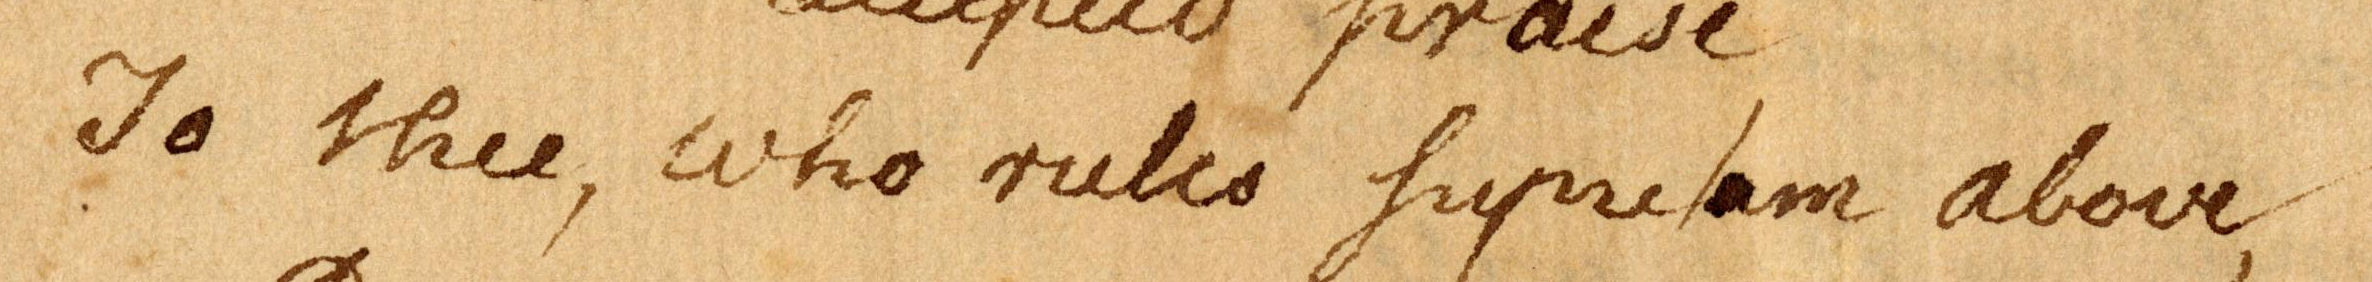To thee, who rules Supream above,
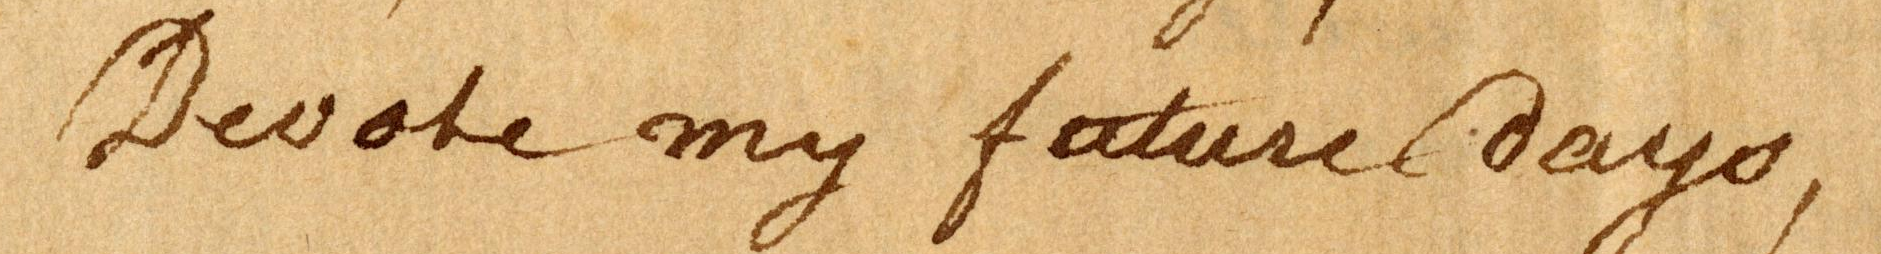Devote my future days,
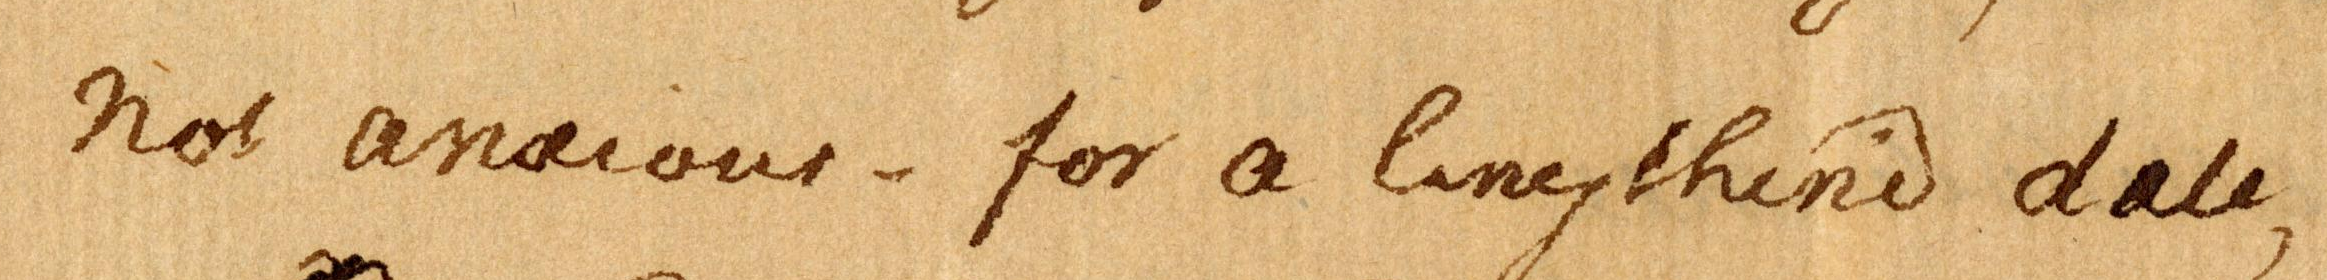Not anxious- for a lengthen'd dale,
